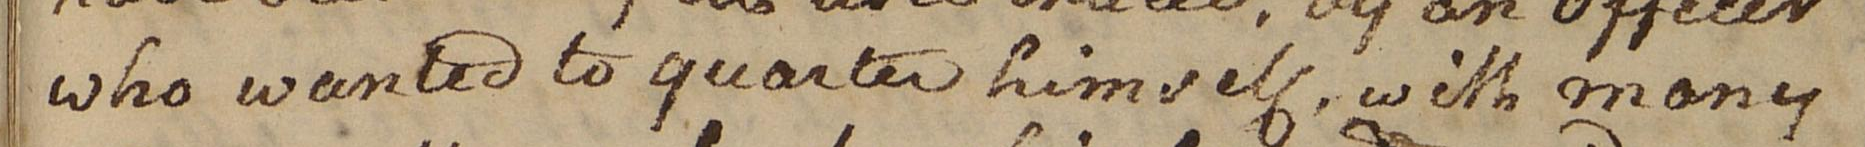who wanted to quarter himself, with many
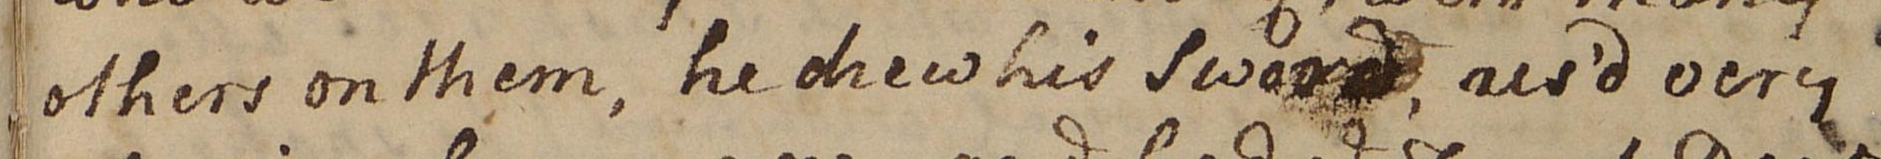others on them, he drew his Sword, res'd very
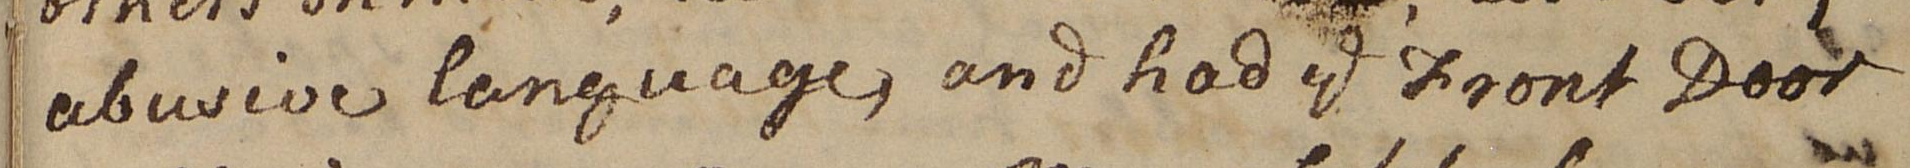abusive language, and had y^e Front Door
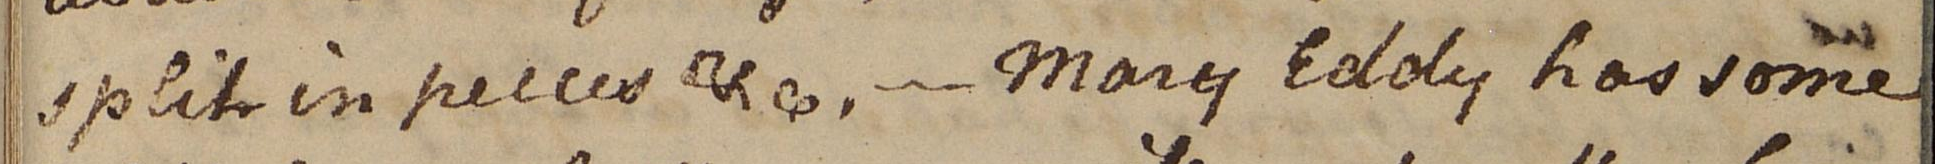split in peeces &c.- Mary Eddy has some
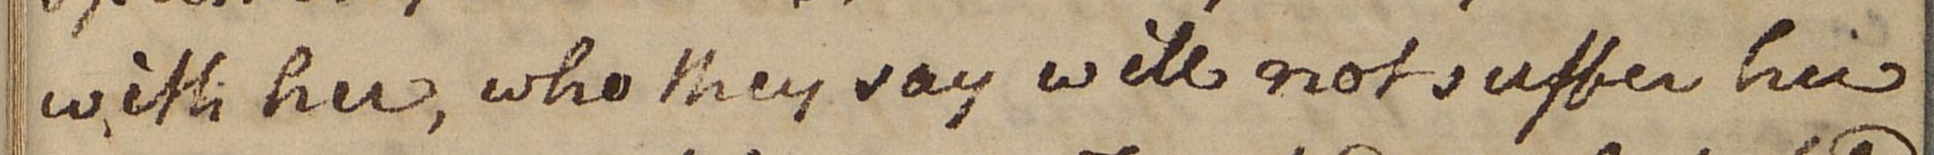with her, who they say will not suffer his
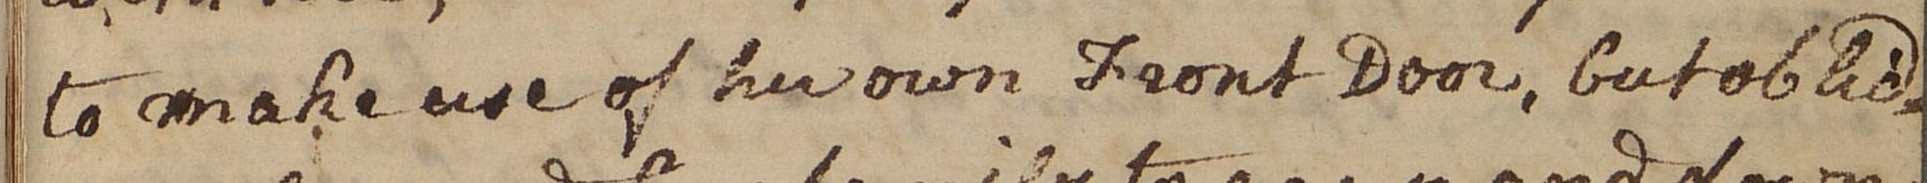to make use of her own Front door, but oblid-
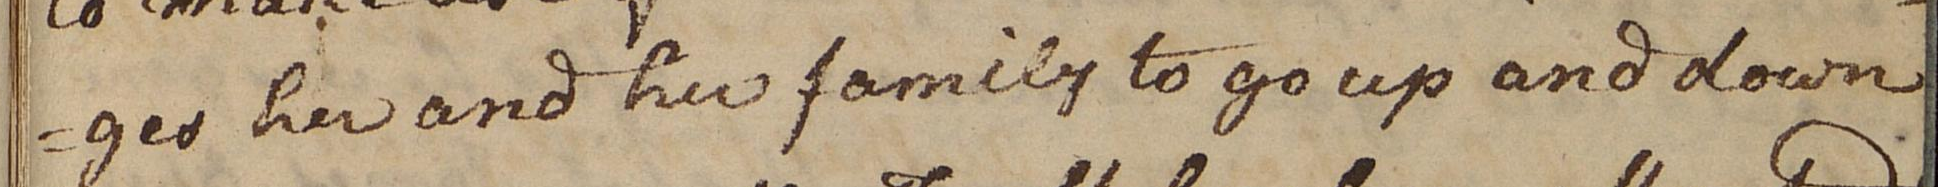-ges her and her family to go up and down
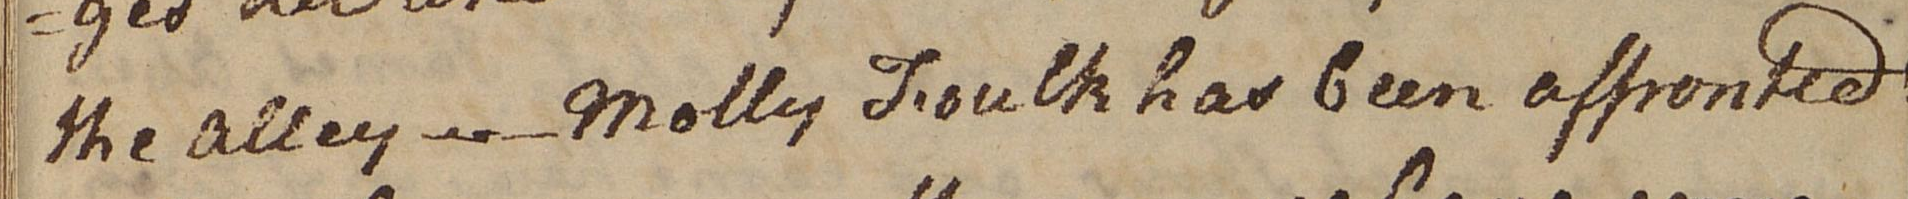the Alley- Molly Foulk has been affronted
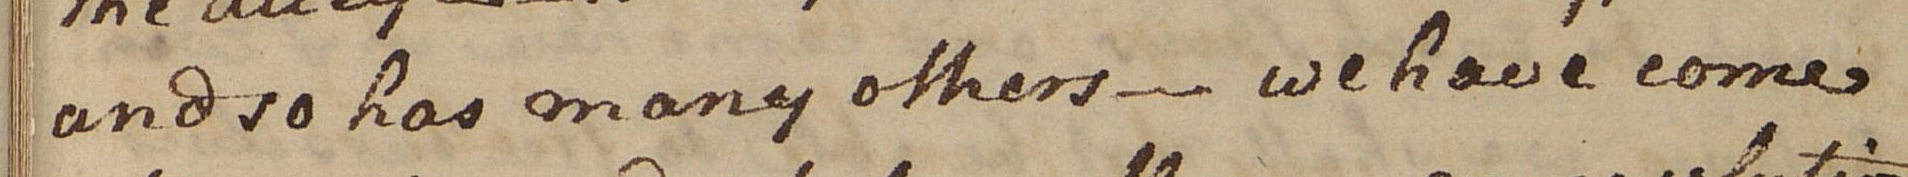and so has many others- we have come
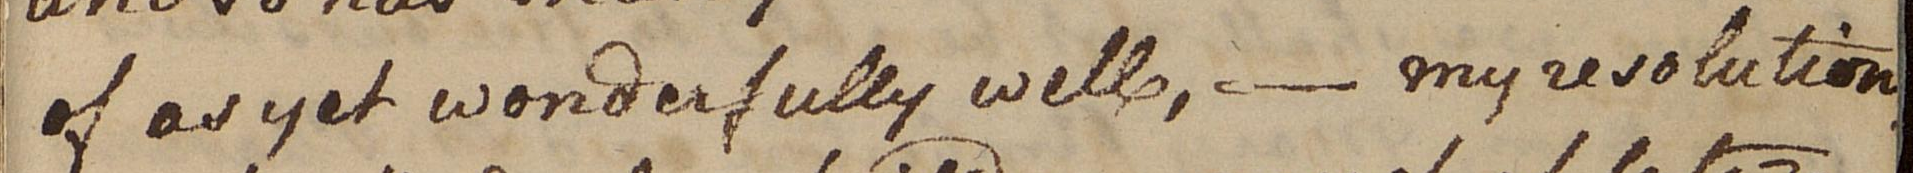of as yet wonderfully well,- my resolution
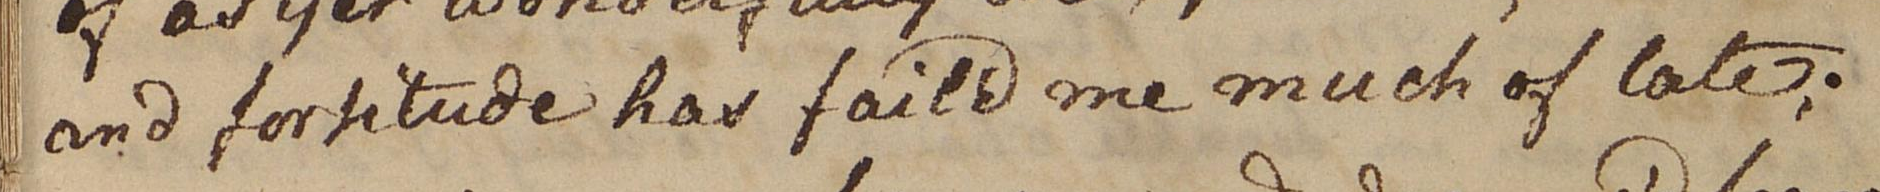and fortitude has fail'd me much of late;
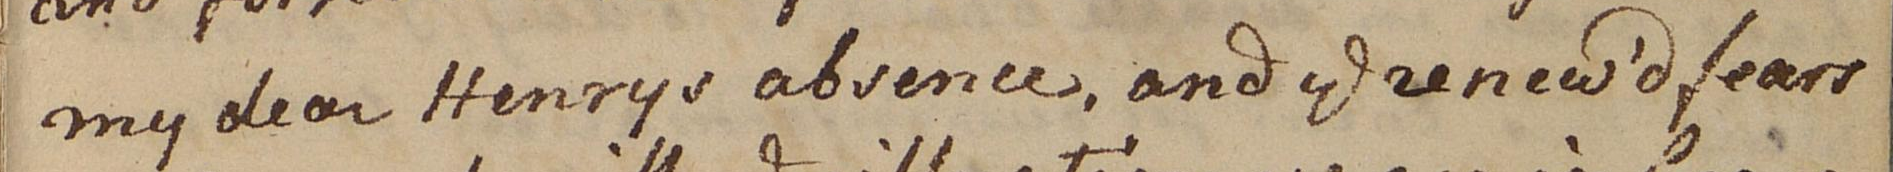my dear Henrys absence, and y^e renew'd fears
